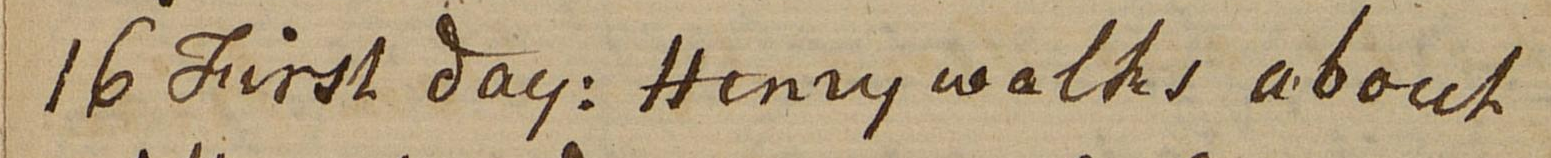16 First day: Henry walks about
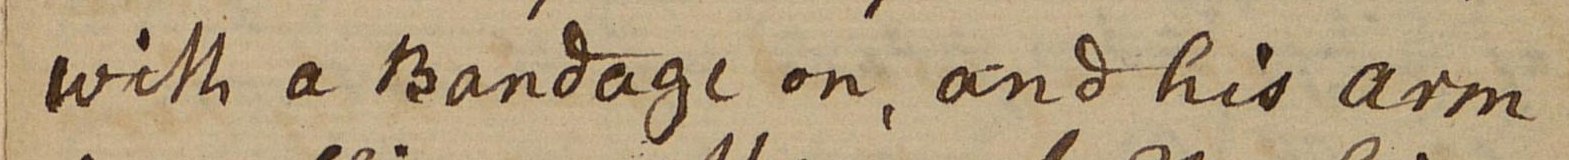with a Bandage on, and his arm
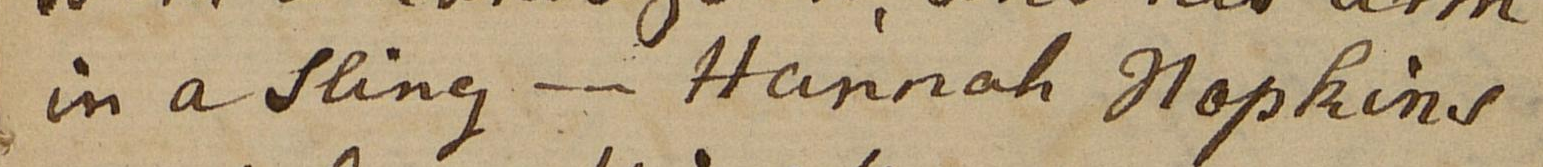in a Sling- Hannah Hopkins
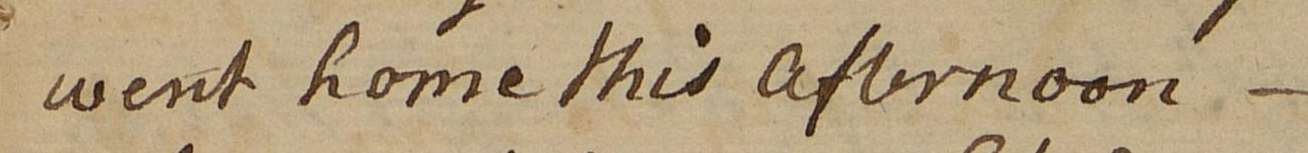went home this afternoon-
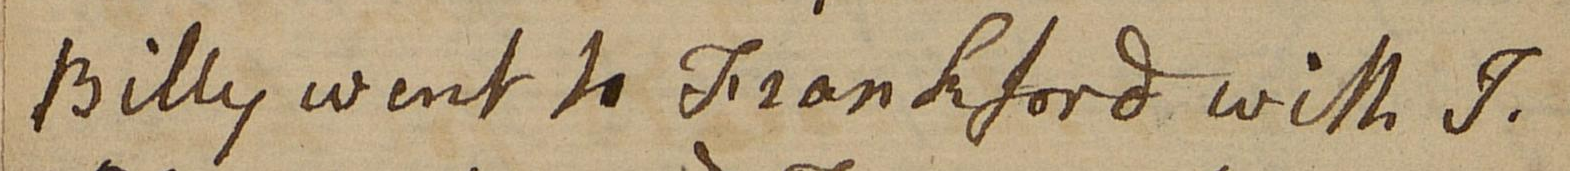Billy went to Frankford with T.
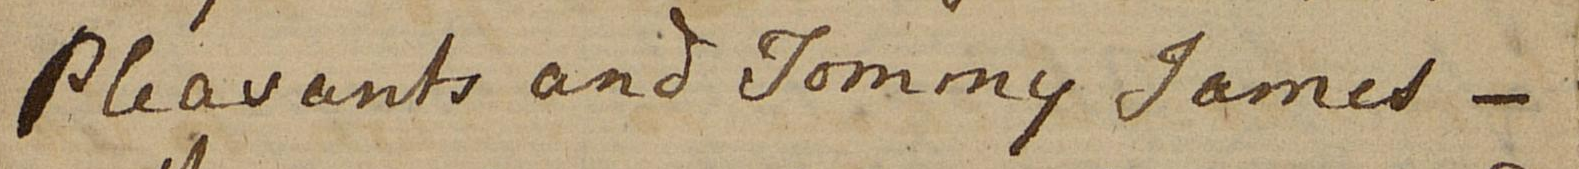Pleasants and Tommy James-
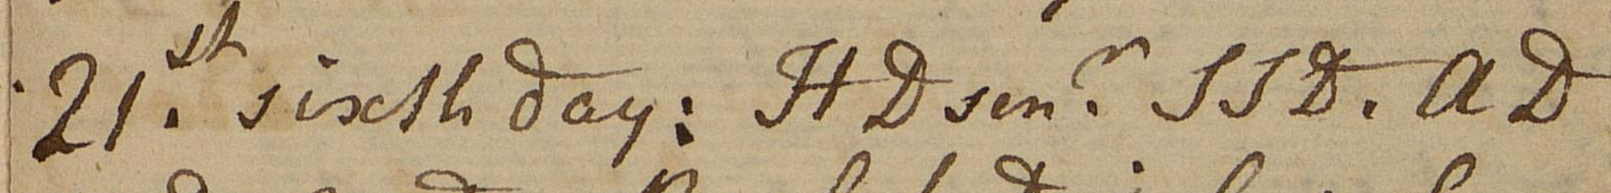21^st. sixth day: HD sen^r. SSD. A D
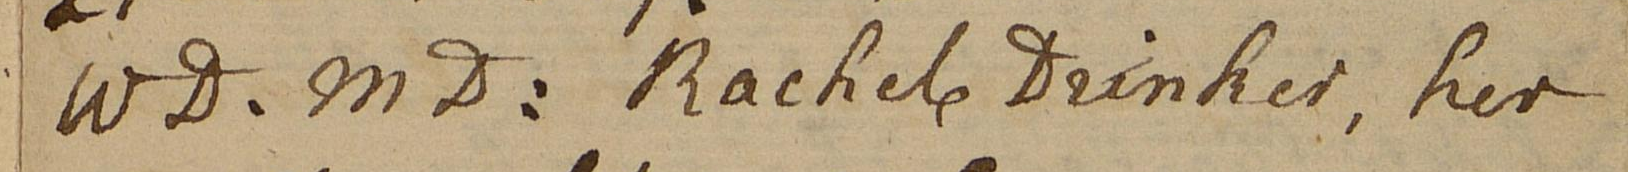WD. MD: Rachel Drinker, her
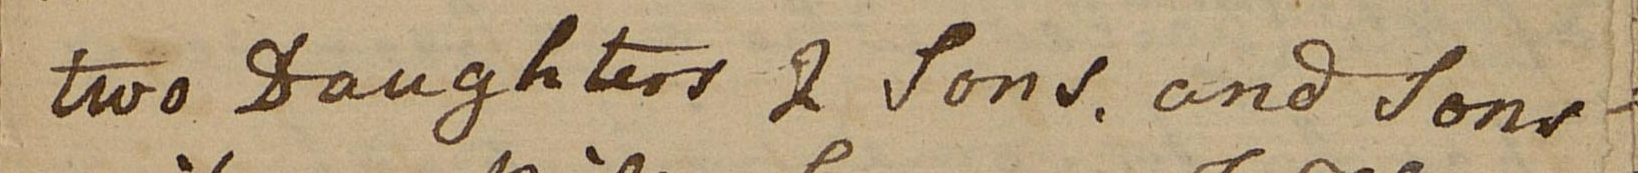two Daughters 2 Sons, and Sons
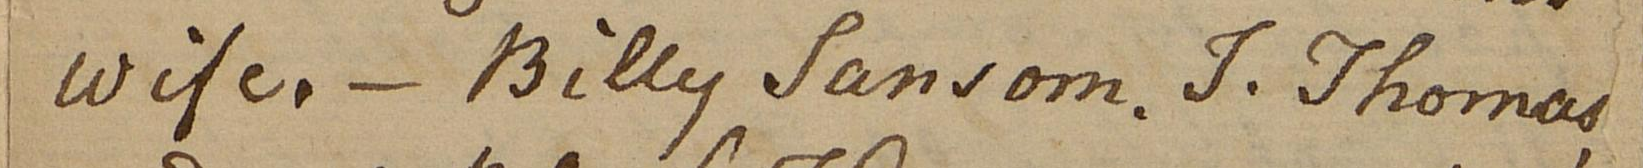Wife.- Billy Sansom, T. Thomas,
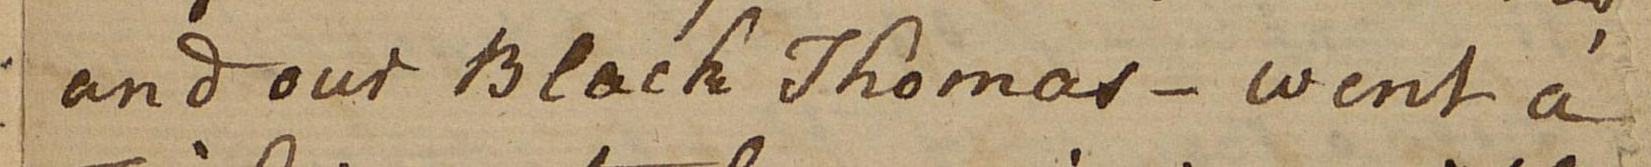and our Black Thomas- went a
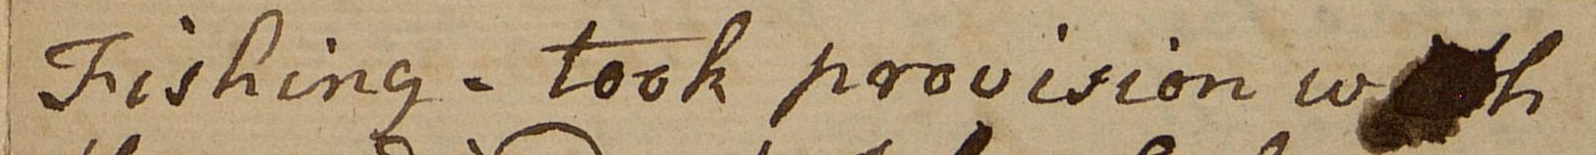Fishing- took provision w[it]h
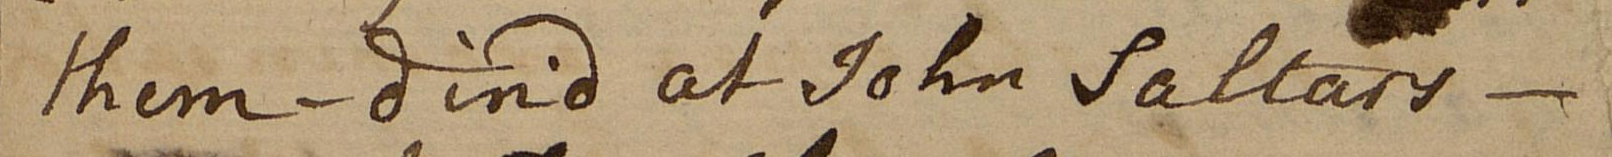them- din'd at John Saltars-
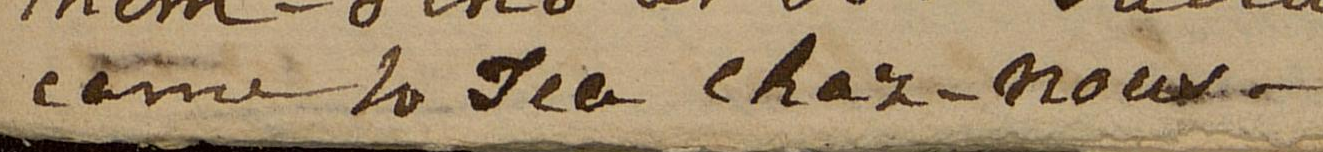came to Tea chaz-nous-
